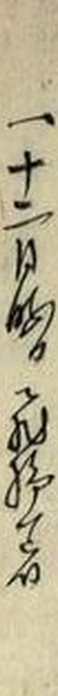一十二月晦日飛脚着
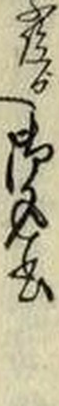御返書
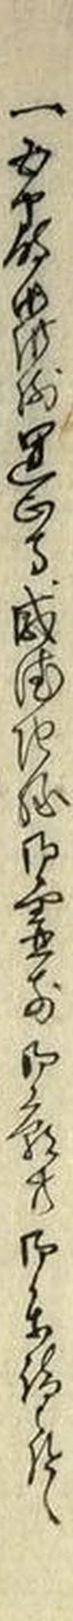一五半時御供揃運正寺威徳院様御霊前御廟共御参詣被遊候
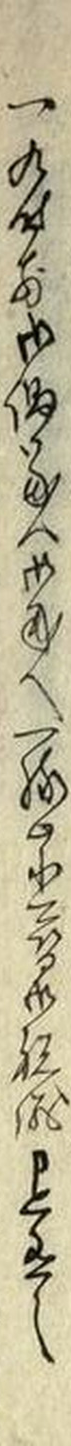一九時前御側御用人御用人一統歳暮御祝儀申上有之
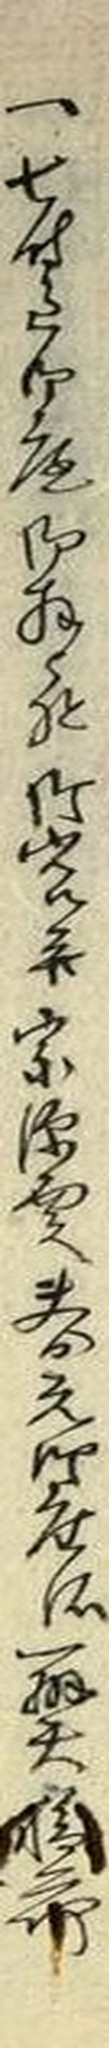一七時過御庭御拝被遊御宮并宗源殿夫ゟ元御座所辨天稲荷
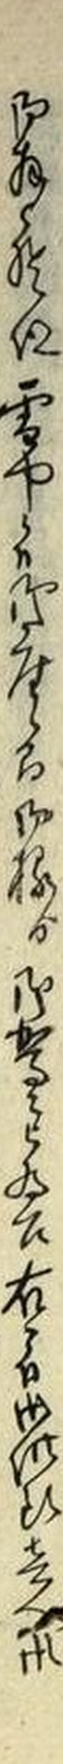御拝被遊但雪中ニ付御座之間御縁ゟ御駕被為召右ニ付御供頭壱人御
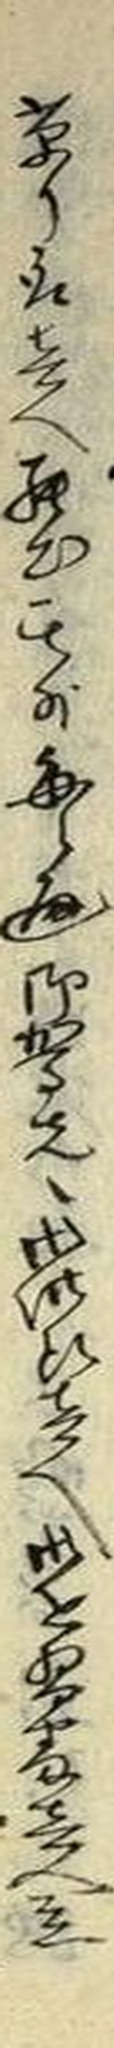草り取壱人罷出其外毎之通御駕先へ御供頭壱人御近習番壱人立
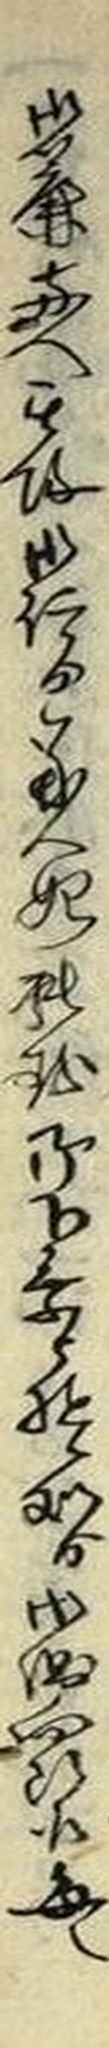御簾両人其餘御跡ゟ御用人始罷越御下乗被遊候処ゟ御側向頭取毎之
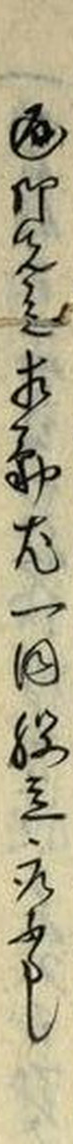通御先立相勤尤一同股立取不申候

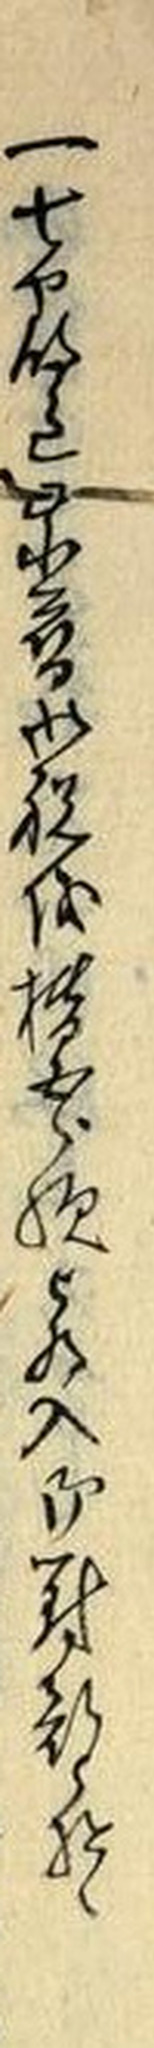一七半時過歳暮御祝儀揩五郎様被為入御対顔被遊候
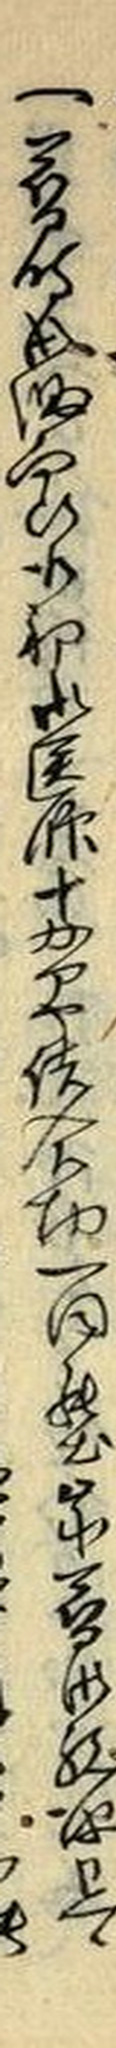一暮時御側向頭取初御医師両部や詰合切一同罷出歳暮御祝儀申上候
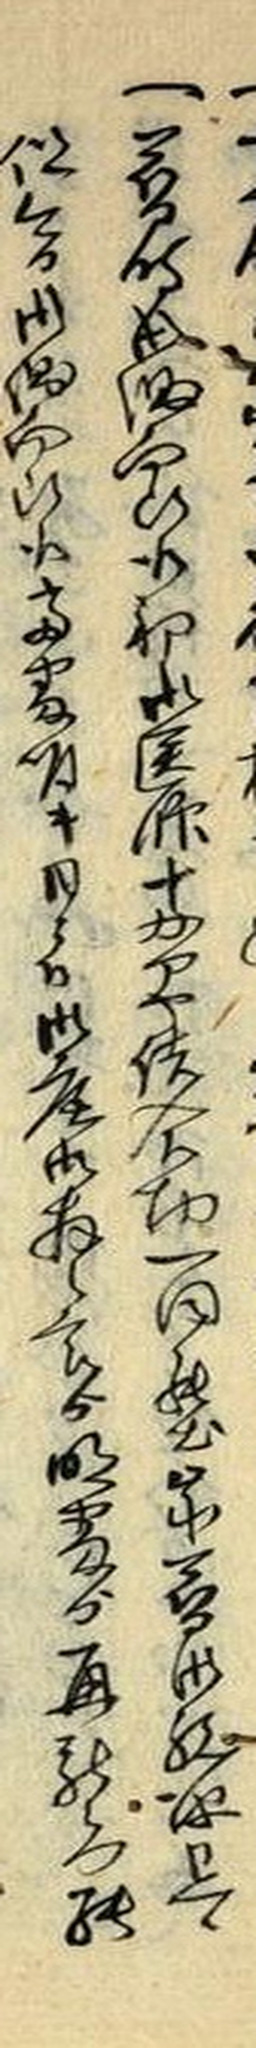但今日御側向頭取当番明キ日ニ付御庭御拝候節ゟ明番ゟ再新右衛門罷
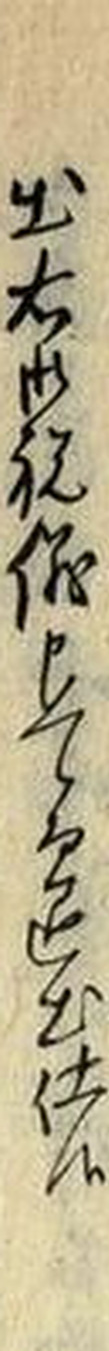出右御祝儀申上候而退出仕候
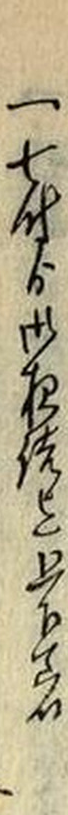一七時ゟ御夜詰迄上下着
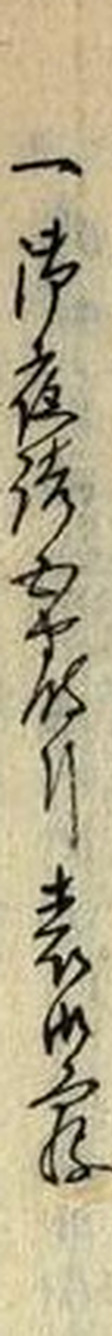一御夜詰五半時引表御寝
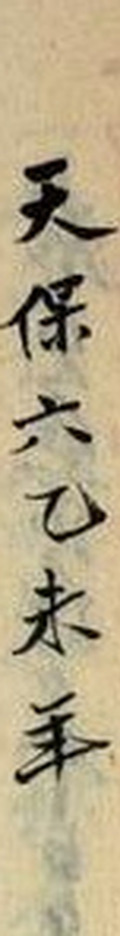天保六乙未年
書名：少傅日録抄（斉承付側向頭取日記、在国）
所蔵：福井県文書館 Fukui Prefectural Archives
